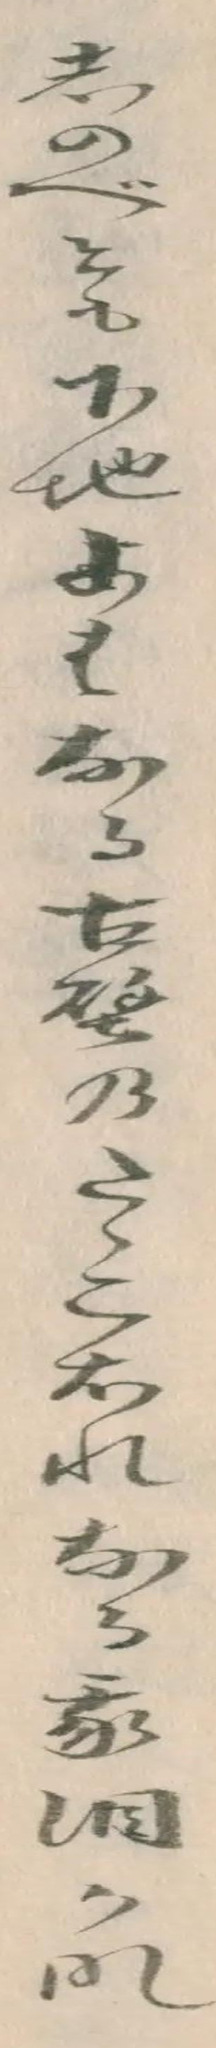しのべとも下地よはなる古壁のたゝこほれなる我泪かな
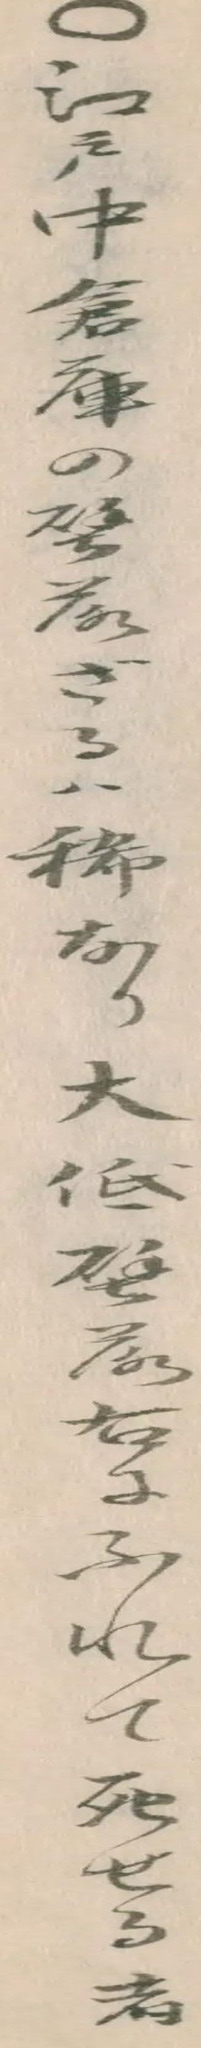〇江戸中倉庫の壁落ざるは稀なり大抵壁落右にふれて死せる者
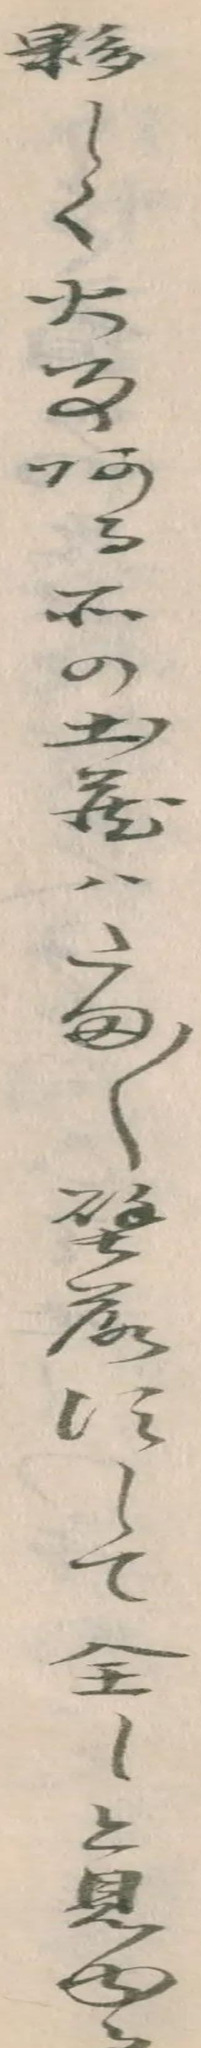夥しく火事ある所の土蔵はたま〳〵壁落すして全しと見ゆる
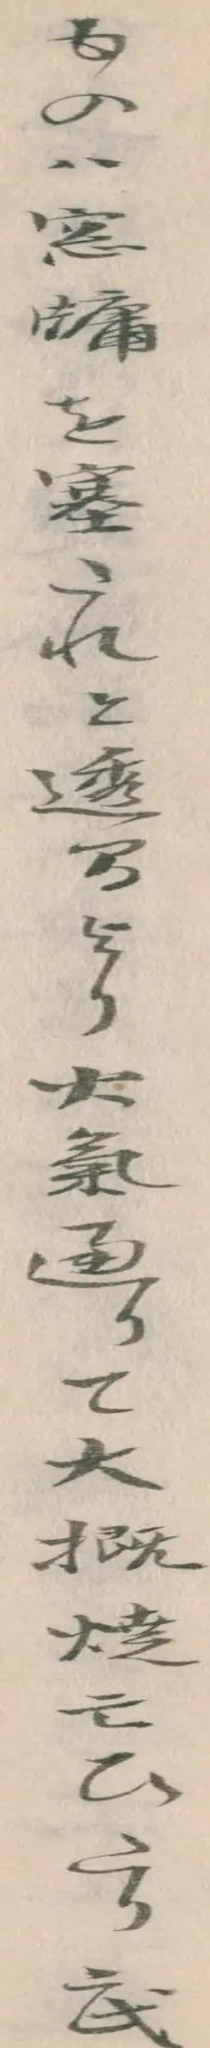ものは窓牖を塞たれと透間より火気通りて大概焼亡ひたり武
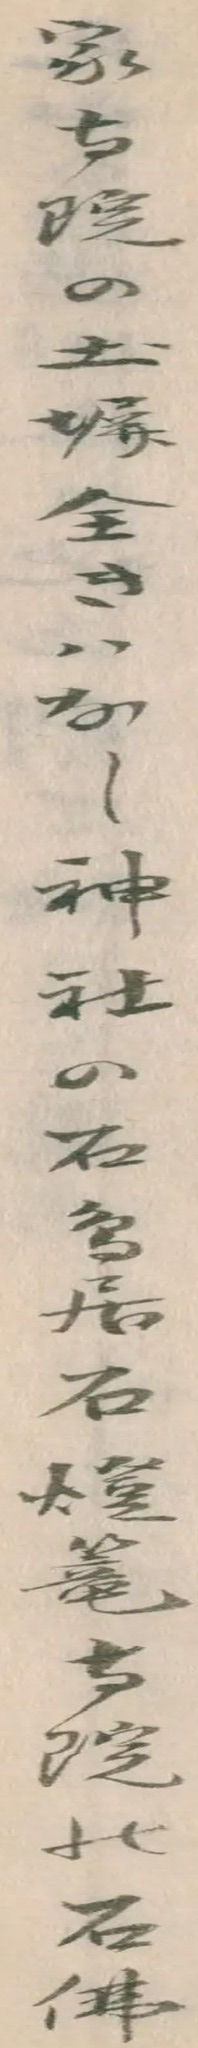家寺院の土蔵全きはなし神社の石鳥居石燈篭寺院の石仏
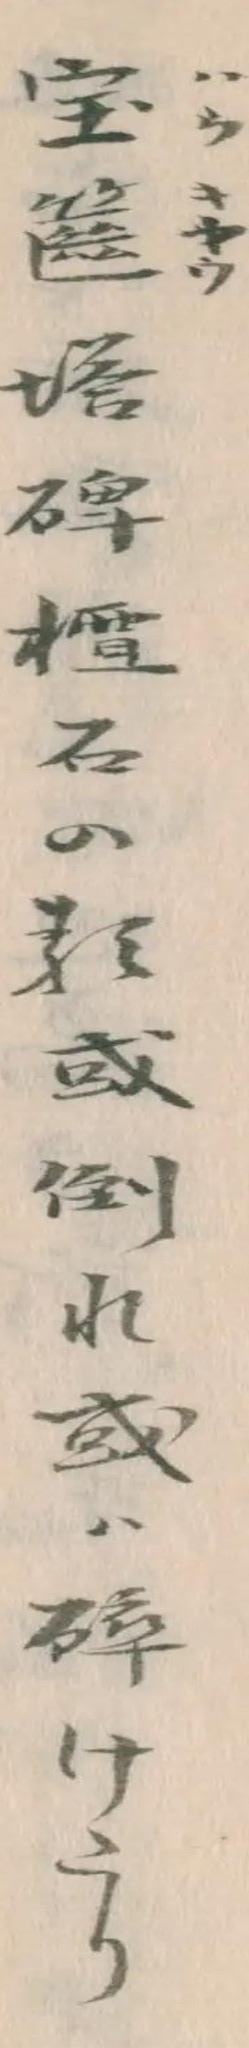宝篋塔碑檀石の類或倒れ或は砕けたり
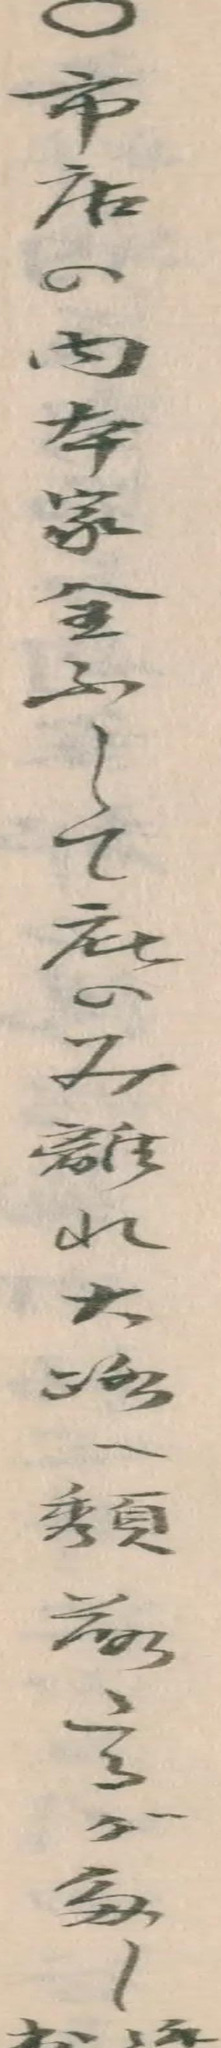〇市店の内本家全ふして庇のみ離れ大路へ頽落たるが多し逃出
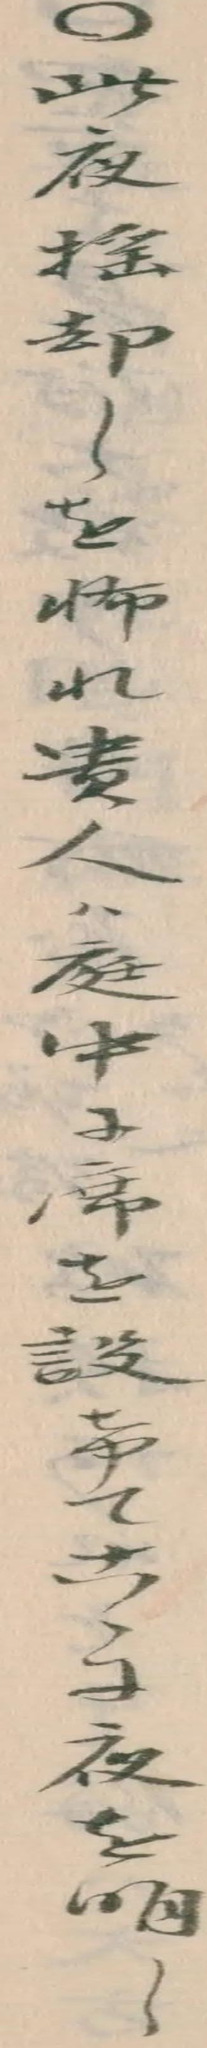〇此夜揺却しを怖れ貴人は庭中に席を設けてこゝに夜を明し
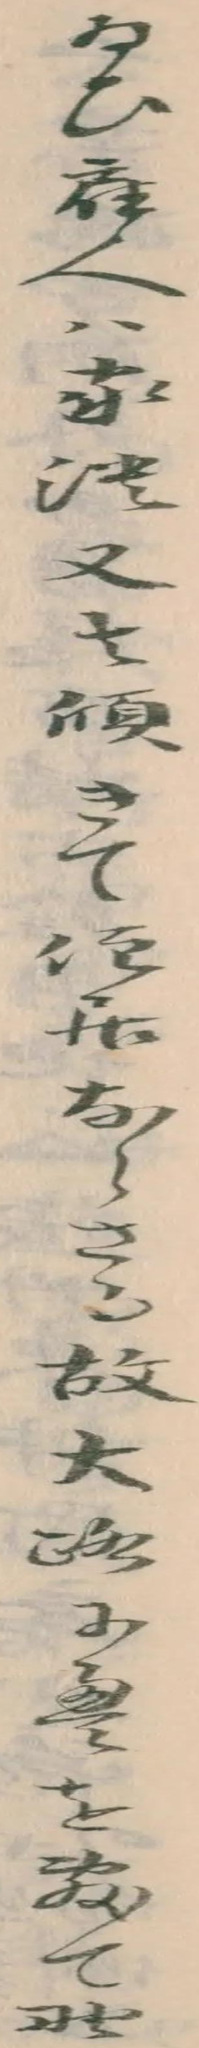給ひ雇人は家潰又は傾きて住居ならさる故大路に畳を敷て野
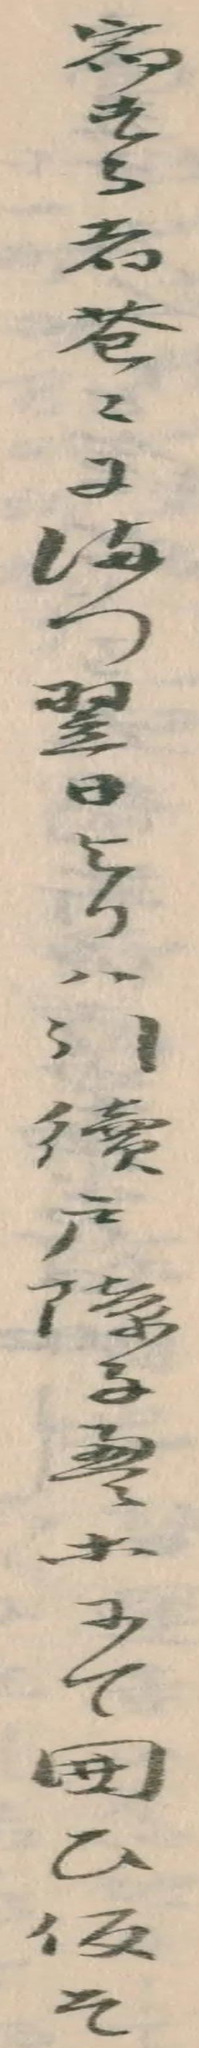宿する者巷々に滿つ翌日よりは引続戸障子畳等にて囲ひ仮そ
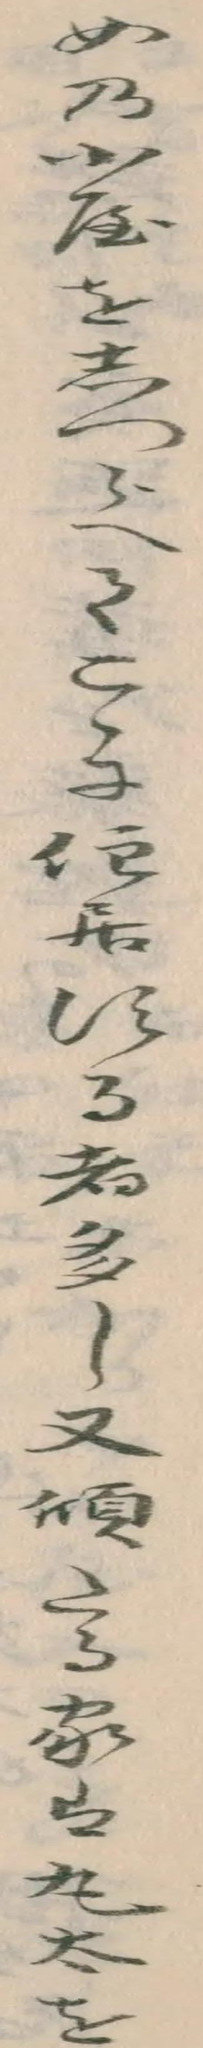めの小屋をしつらへてこゝに住居する者多し又傾たる家は丸太を
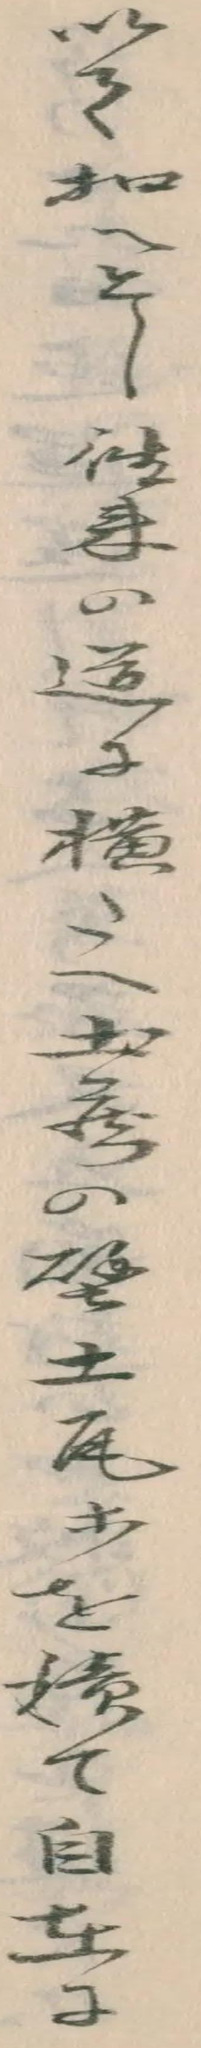以て扣とし往来の道に横たへ土蔵の壁土瓦等を積て自在に
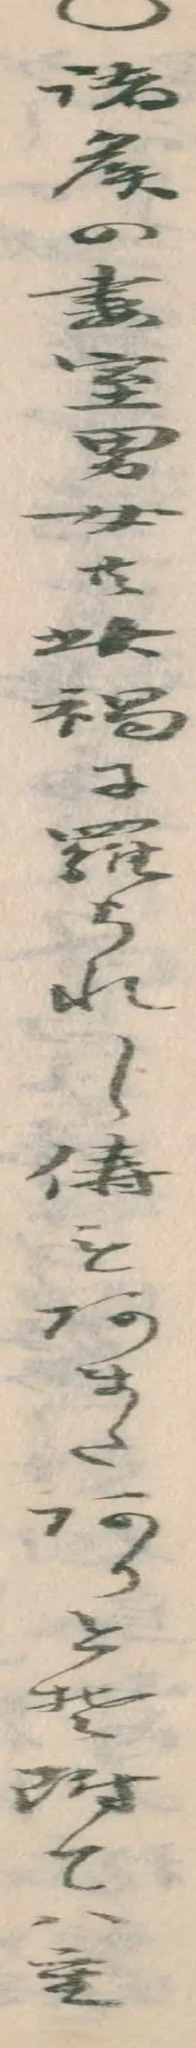〇諸侯の妻室男女共此禍に罹られし俦もあまたありとそ附ては重
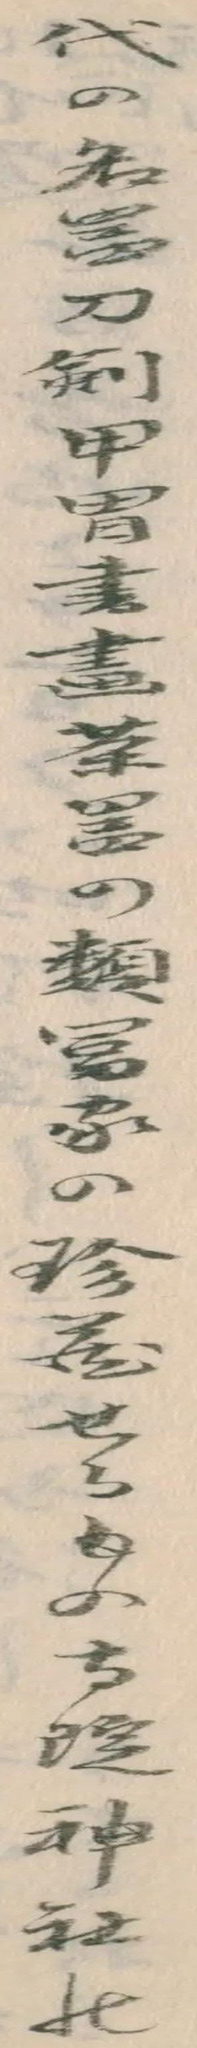代の名器刀剣甲冑書画茶器の類冨家の珍蔵せるもの寺院神社の
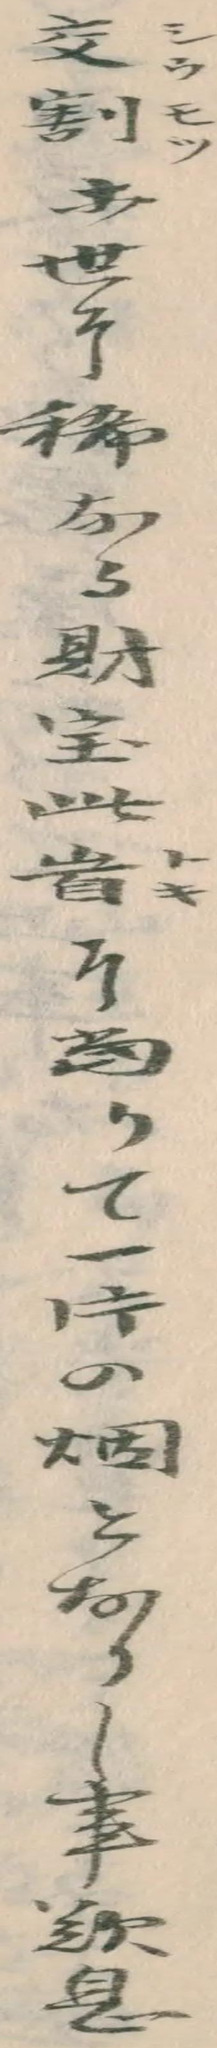交割等世に稀なる財宝此旹に当りて一片の烟となりし事歎息

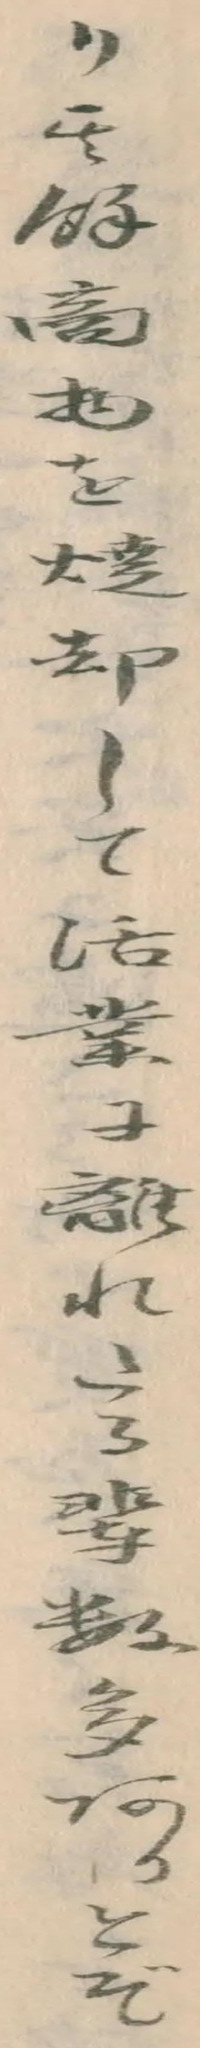り其余商物を焼却して活業に離れたる輩数多ありとぞ
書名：地災撮要. 巻7-9(地震之部)
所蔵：国立国会図書館 National Diet Library, JAPAN
